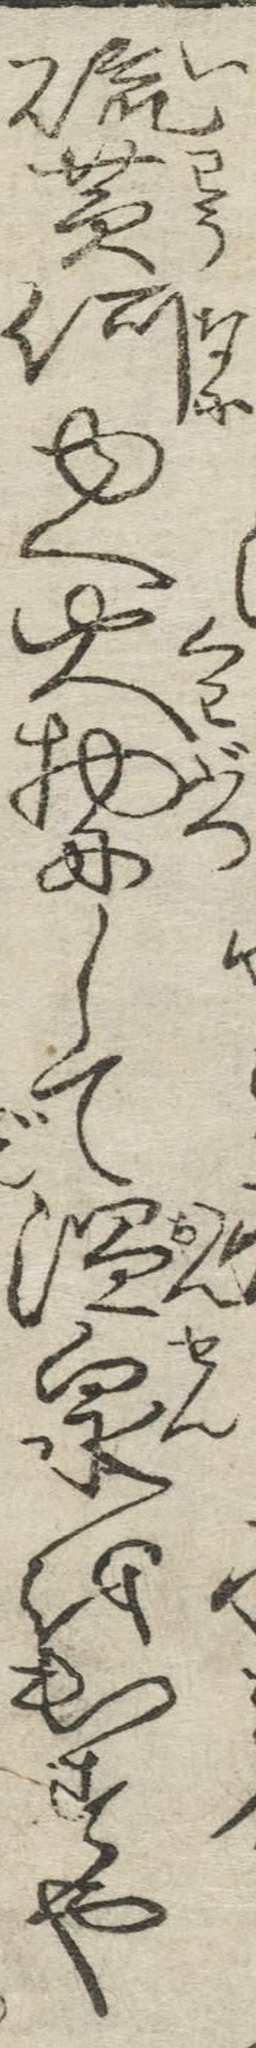硫黄何ゆへ火物にして温泉を出すや
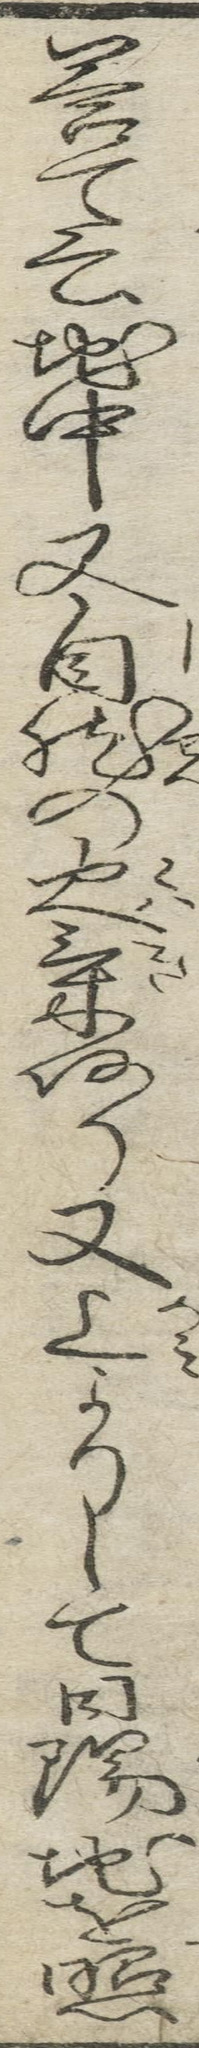答て云地中又自然の火気あり又上よりして日陽地を照

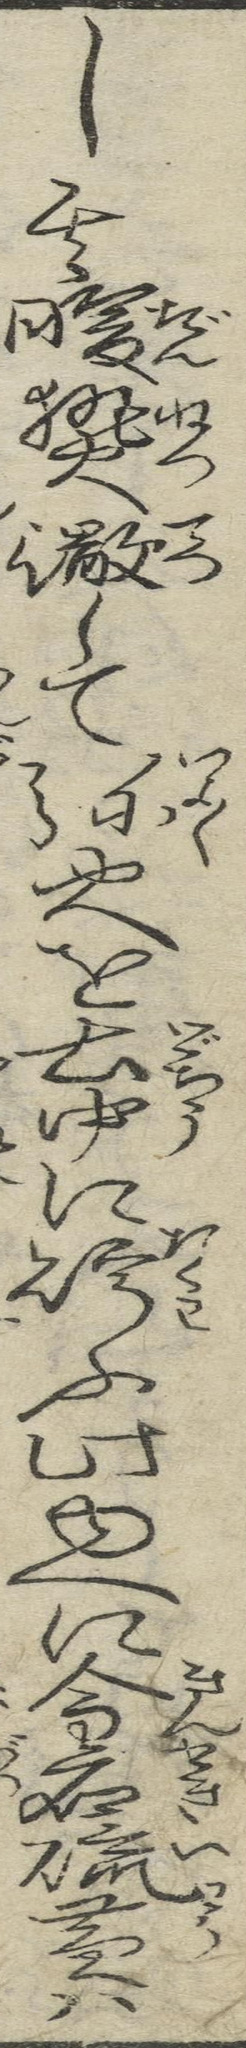し暖熱徹して弥火を土中に貯ふ此ゆへに金石硫黄は
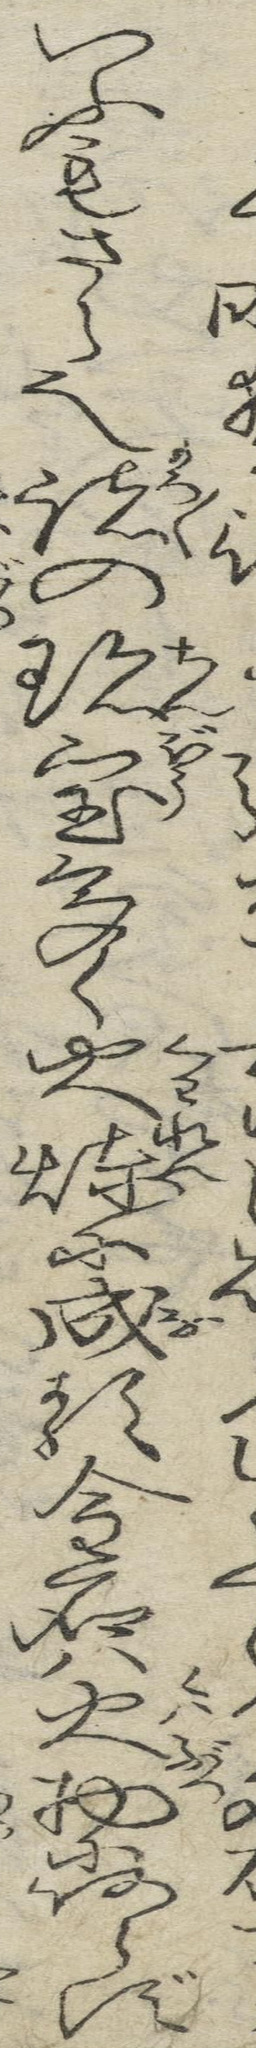いふもさら也諸の珍宝多く火煉に成る金石は火物にあらず
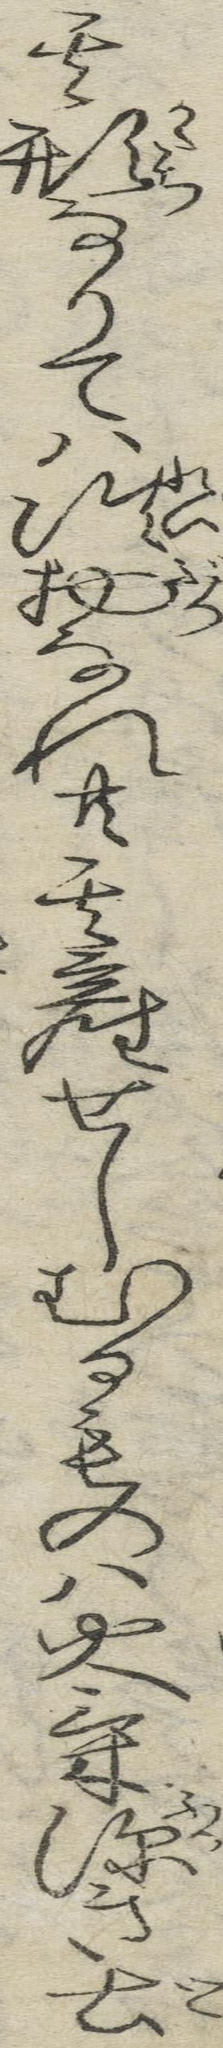其形なりては冷物なれ共其産せしむるものは火気深き土
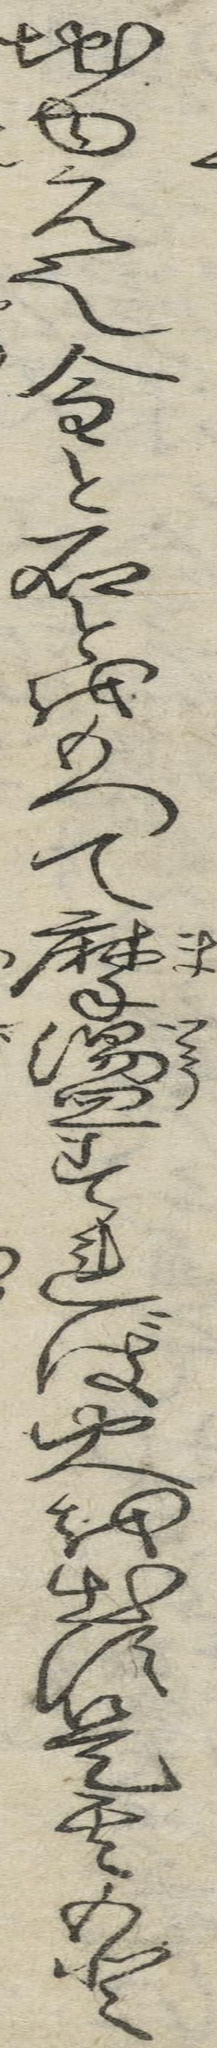地ゆえ也金と石とをもつて摩盪すれば火を出す是其もと
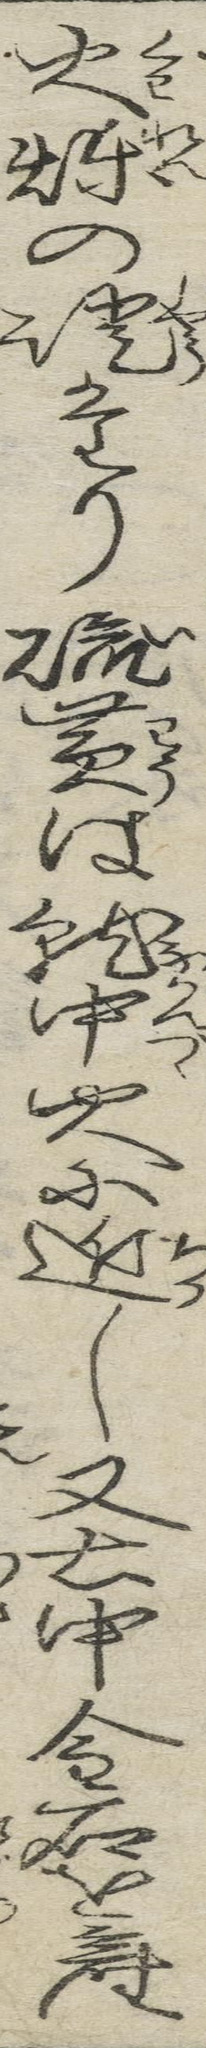火煉の消かより硫黄は就中火に近し又土中金石を産
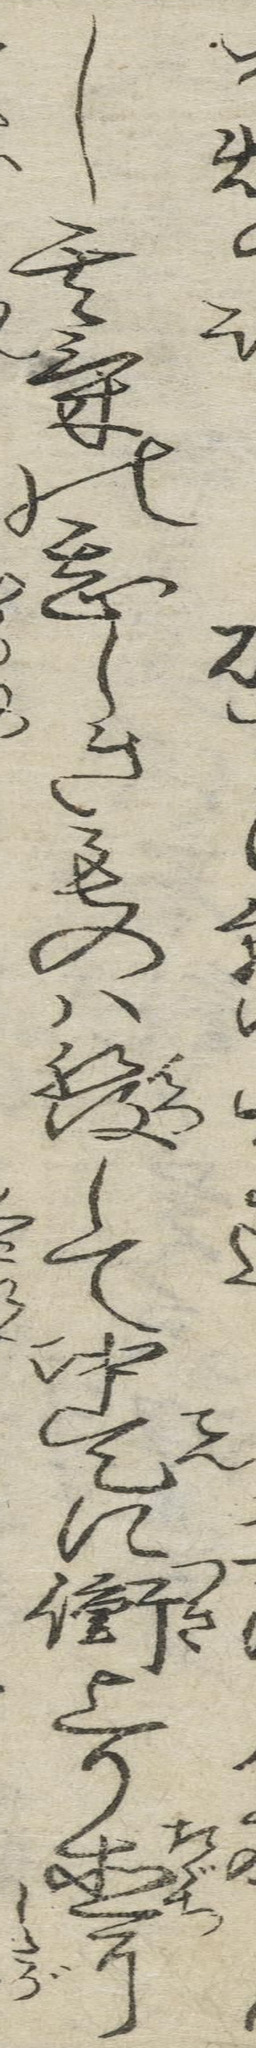し其気の悪しきものは発して中天に衝上り直に
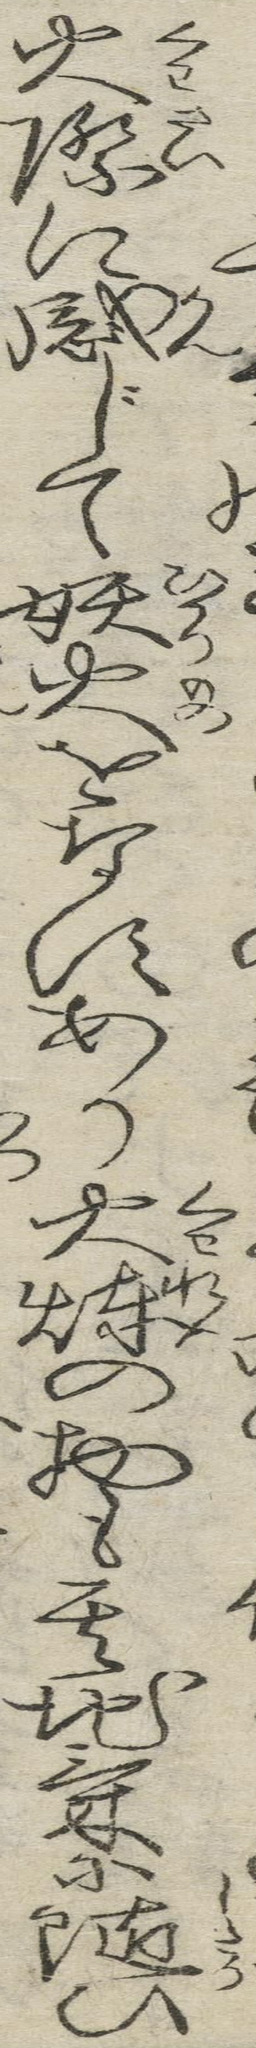火際に感じて妖火をなすあり火煉の物も其地気に随ひ
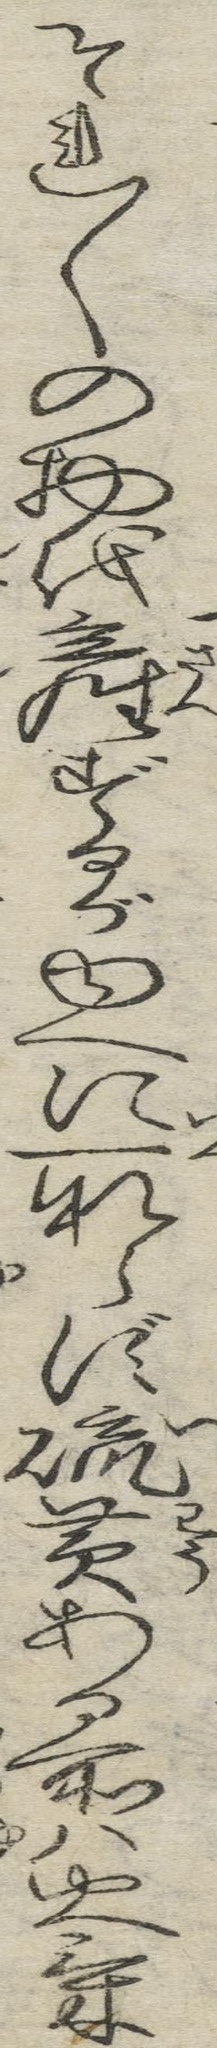それ〳〵の物を産ずるがゆへに一ならず硫黄ある所は火気
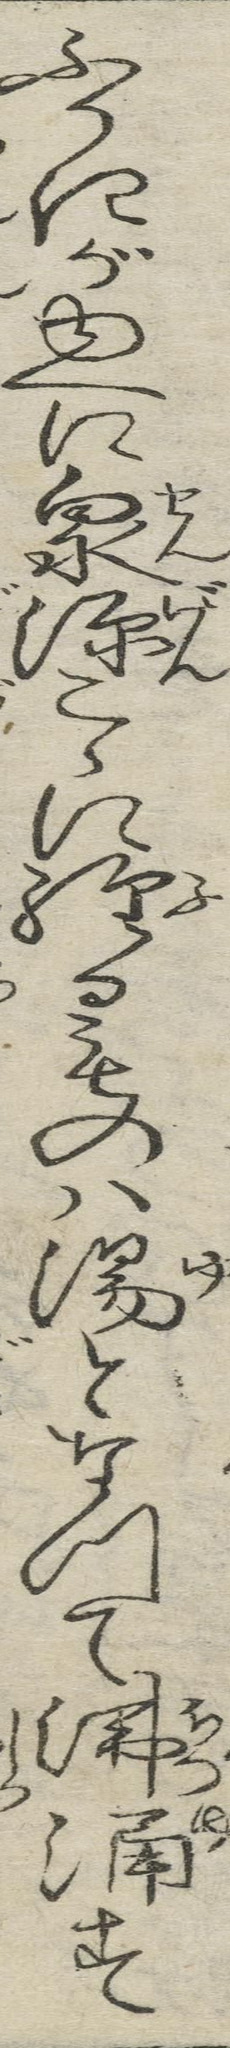ふかきがゆへに泉源こゝに経るものは湯となつて沸湧す
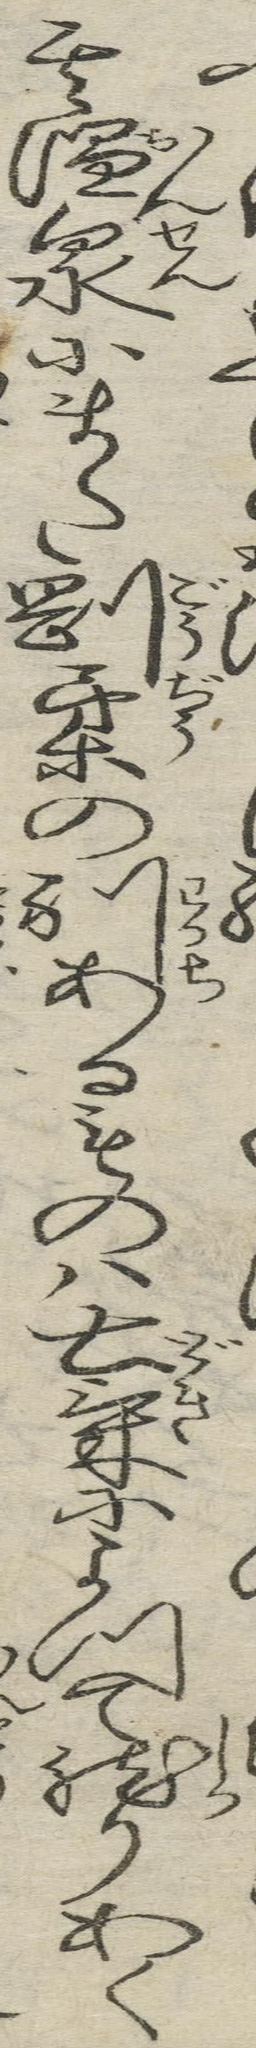其温泉にまた剛柔の列あるものは土気によつて然りあく
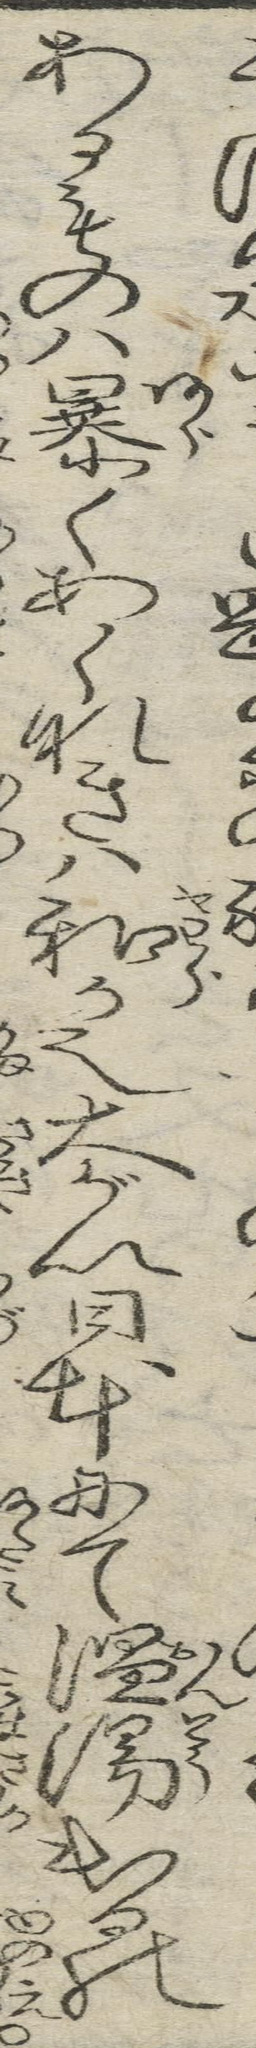あるものは暴くあくなきは和か也大がい日本にて温湯出るの
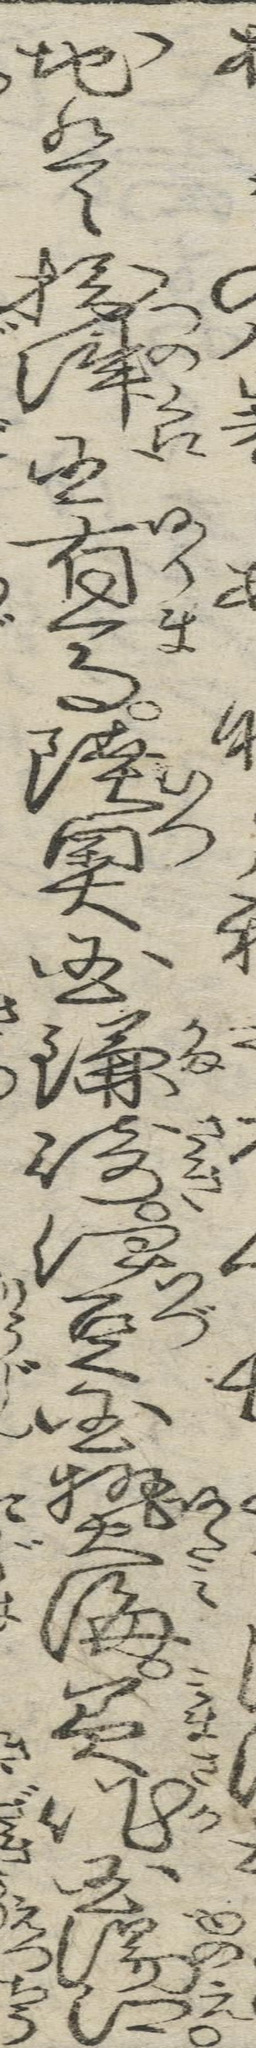地は攝津国有馬。陸奥国鎌崎。伊豆国熱海。美作国湯江。
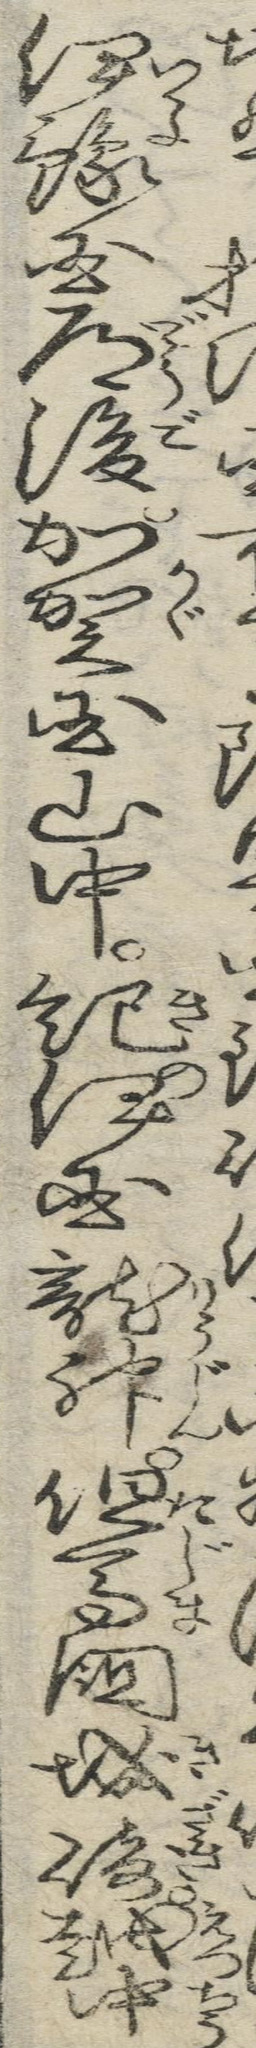伊豫国道後。加賀国山中。紀伊国龍神。但馬国城崎。越中
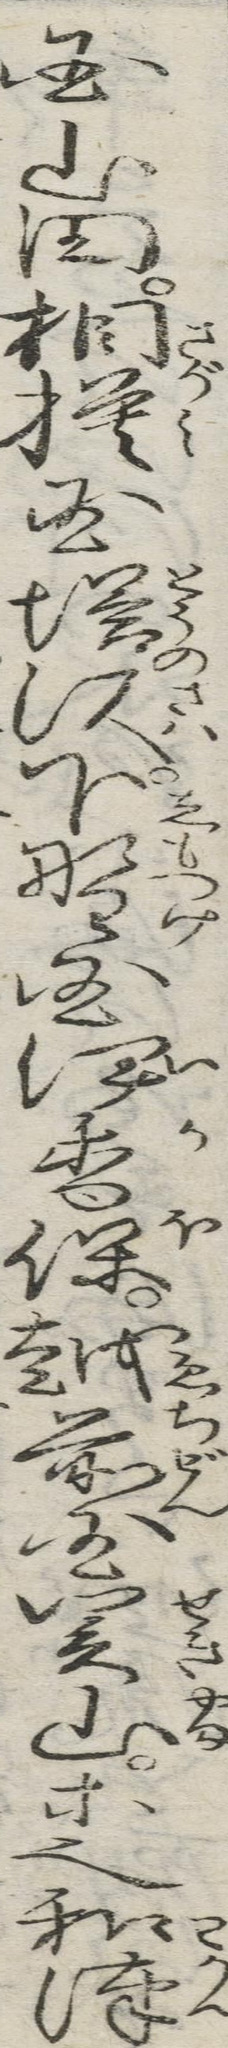国山田。相模国塔沢。下野国伊香保。越前国関山。等也和漢
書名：訓蒙天地辨　地
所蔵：東京大学地震研究所図書室 Earthquake Research Institute Library, The University of Tokyo, JAPAN
